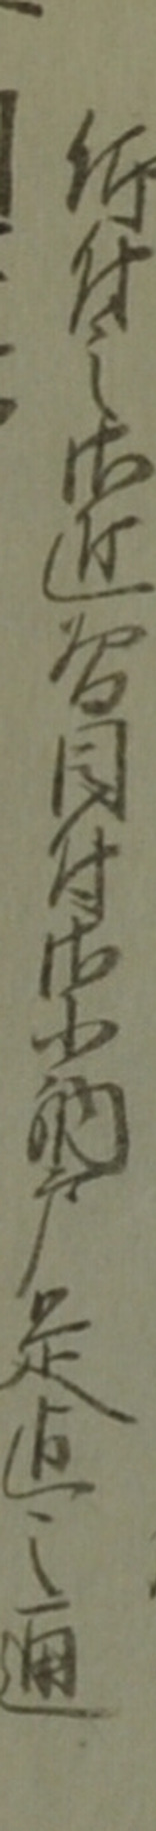仰付之御近習目付御小納戸是迄之通
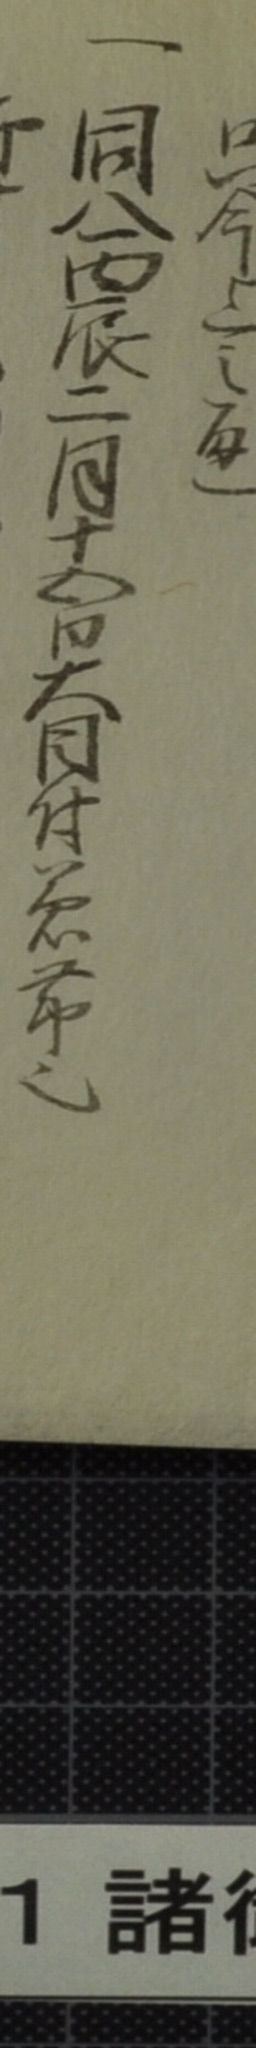一同八丙辰二月十五日大目付兼帯也
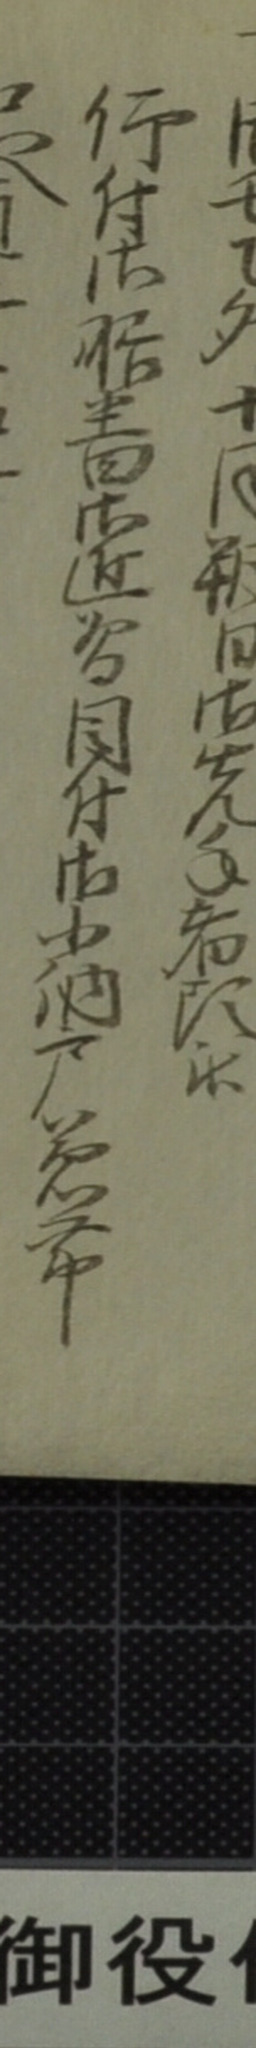仰付御膳番御近習目付御小納戸兼帯
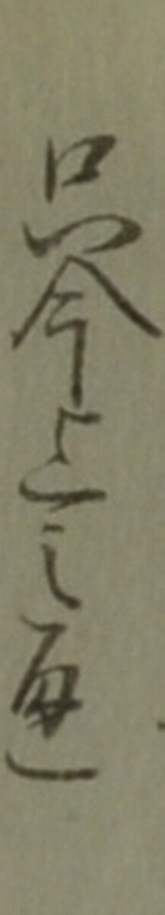只今迄之通
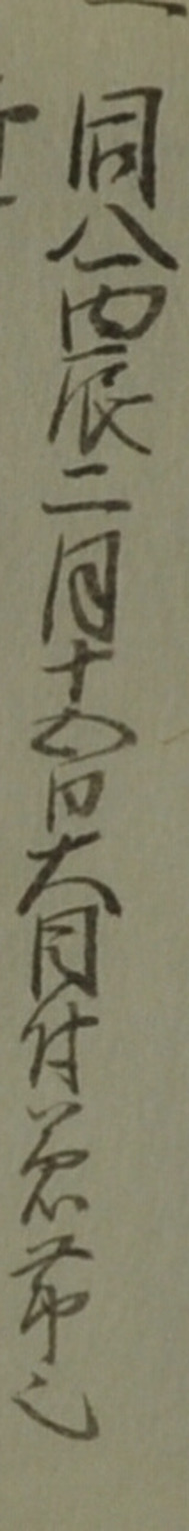一同八丙辰二月十五日大目付兼帯也
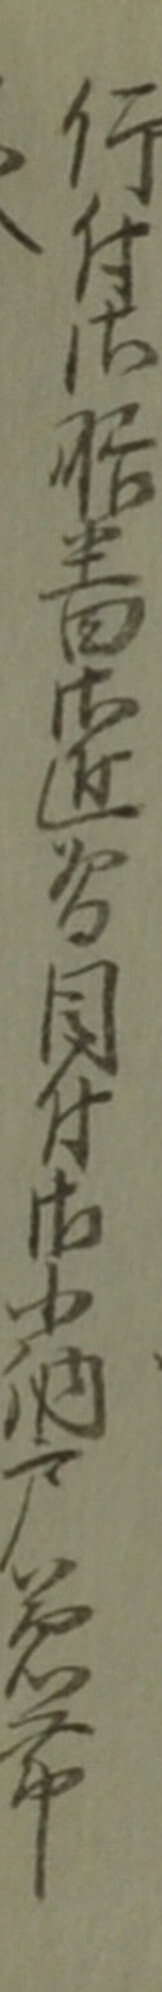仰付御膳番御近習目付御小納戸兼帯
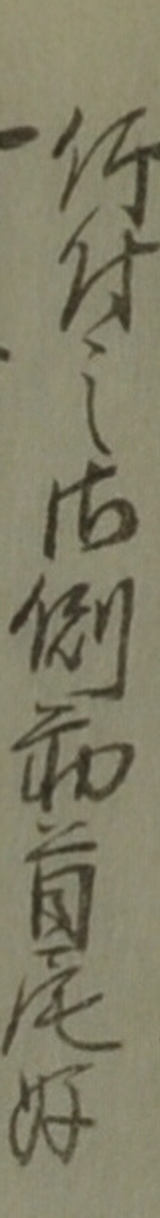仰付之御側首尾好御免
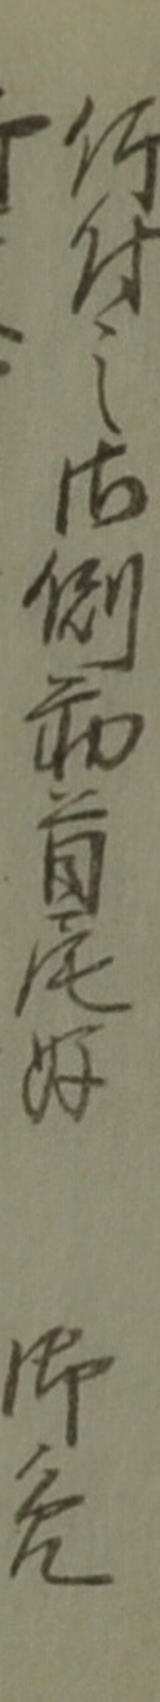仰付之御側首尾好御免
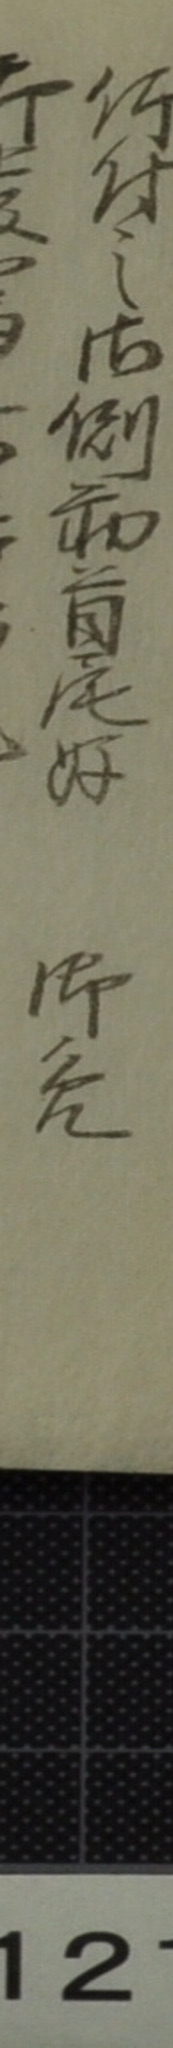仰付之御側首尾好御免
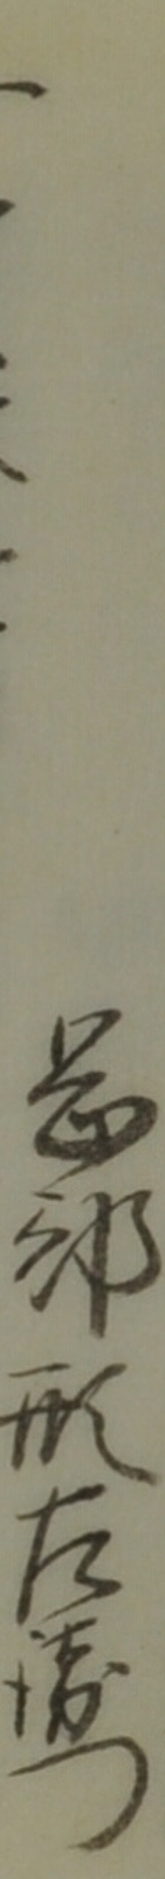岡部形左衛門
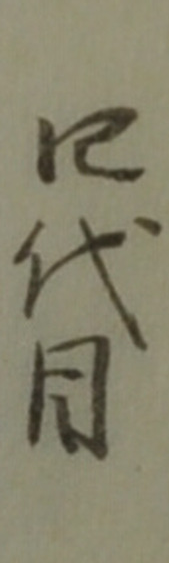四代目
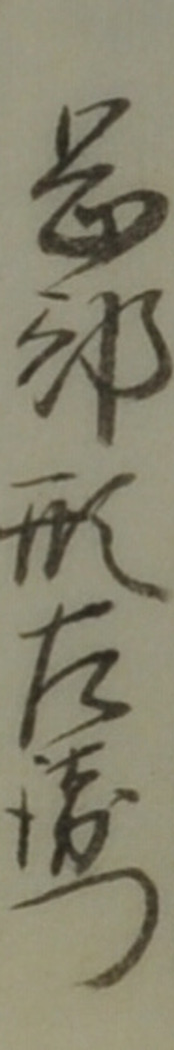岡部形左衛門
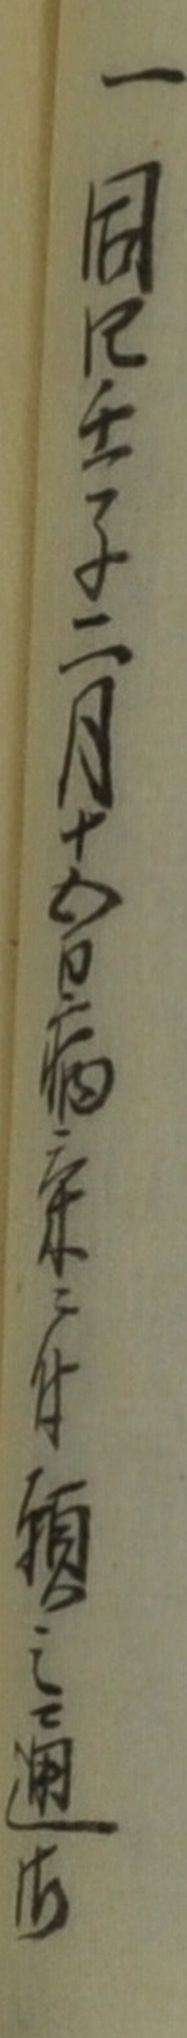一同四壬子二月十五日病気ニ付願之通御
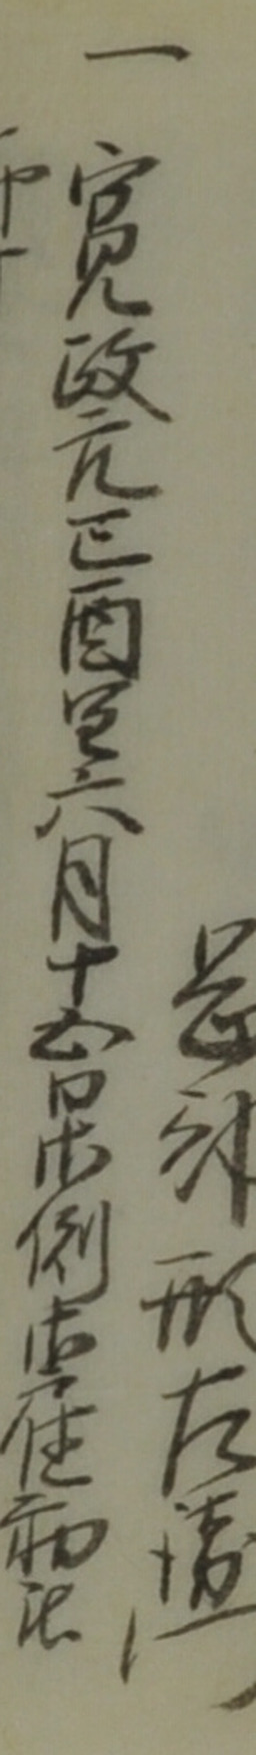一寛政元己酉閏六月十五日御側御雇勤被
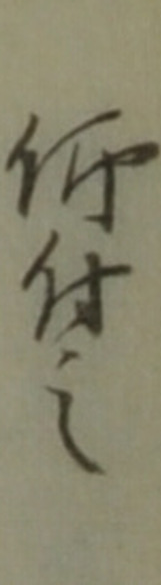仰付之
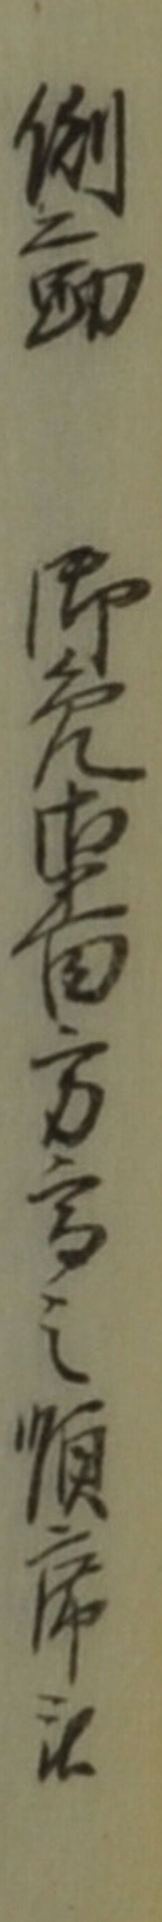側勤御免御番方高之順席被
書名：諸御役代々録（五）
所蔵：伊那市立高遠町図書館・合同会社AMANE
